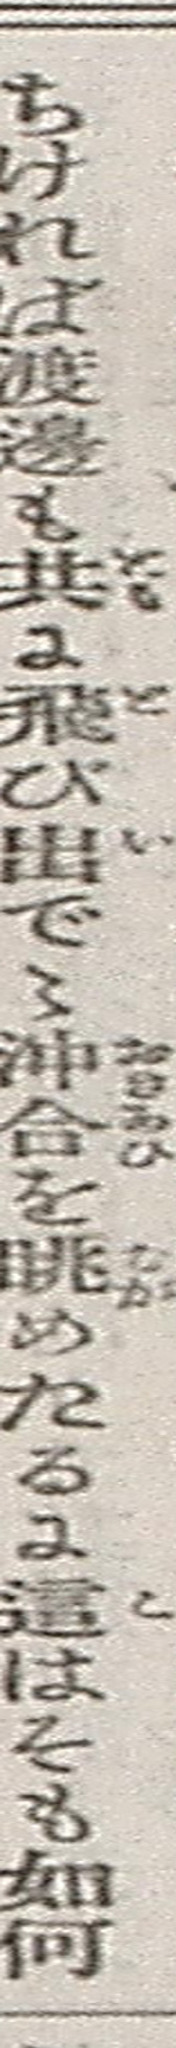ちければ渡邊も共に飛び出で〻|沖合を眺めたるに這はそも如何
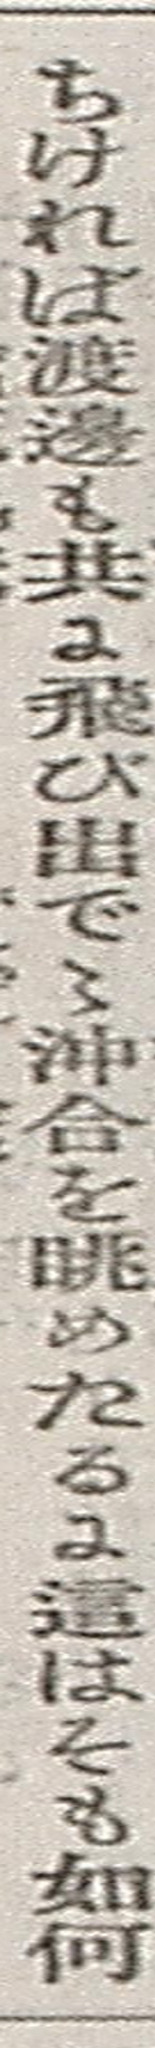ちければ渡邊も共に飛び出で〻|沖合を眺めたるに這はそも如何
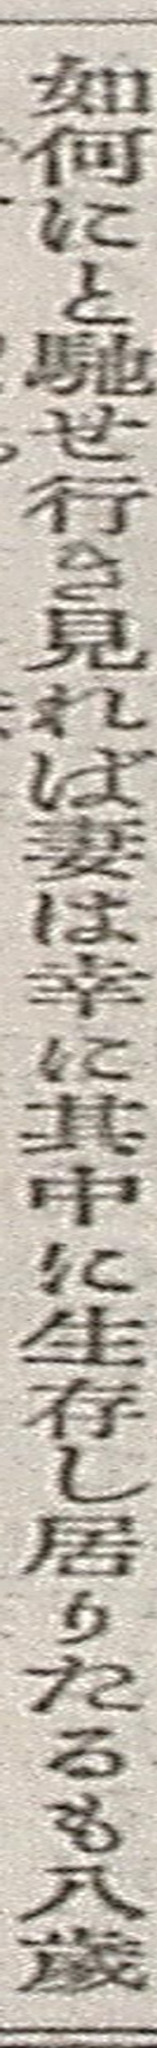如何にと馳せ行き見れば妻は幸に其中に生存し居りたるも八歳
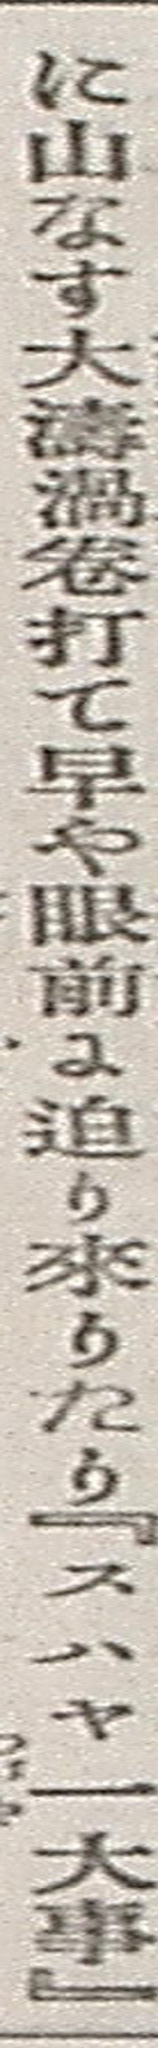に山なす大涛渦巻打て早や眼前に迫り来りたり「スハヤ一大事」
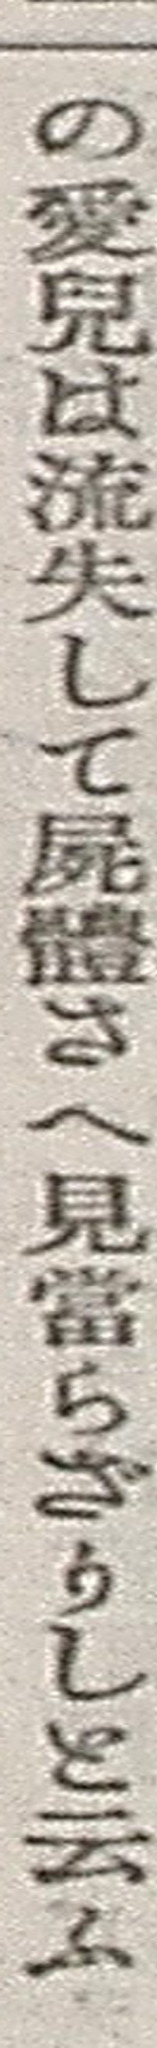の愛児は流失して屍体さへ見当らざりしと云ふ
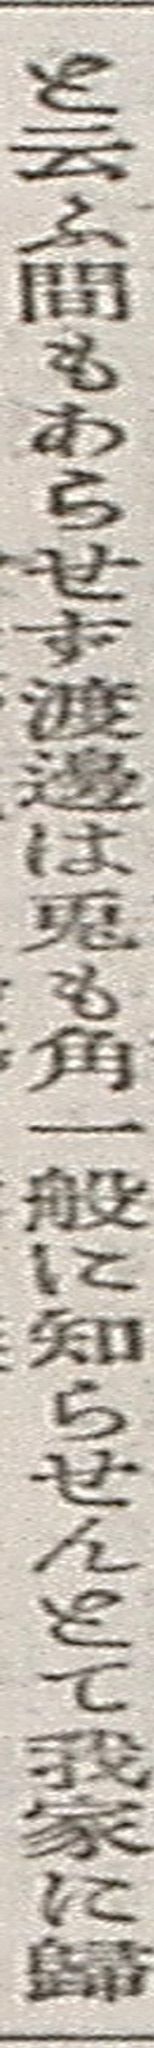と云ふ間もあらせず渡邊は兎も角一般に知らせんとて我家に帰
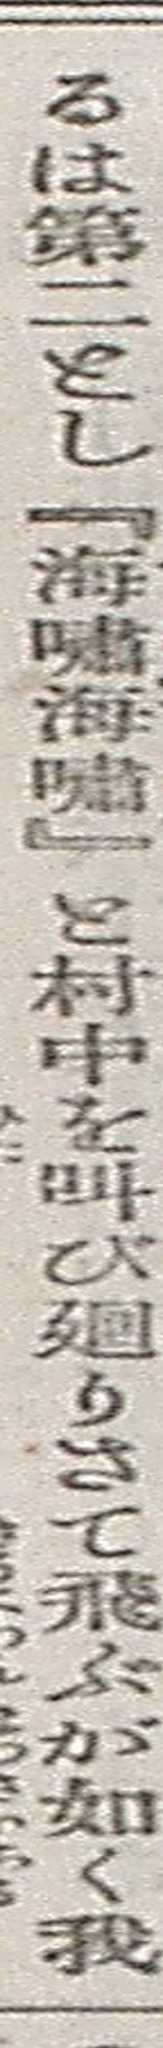るは第二とし「海嘯海嘯」と村中を叫び廻りさて飛ぶが如く我
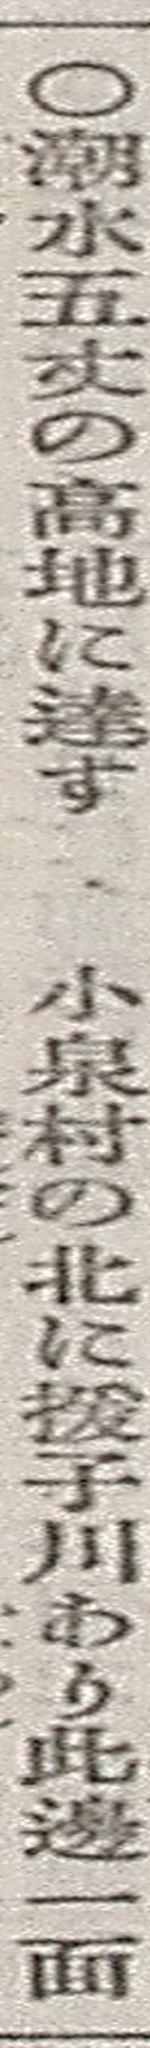〇潮水五丈の高地に達す小泉村の北に援子川あり此辺一面
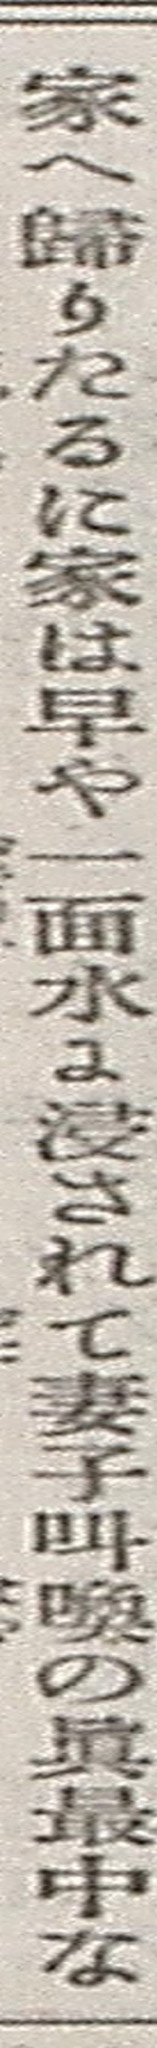家へ帰りたるに家は早や一面水に浸されて妻子叫喚の真最中な
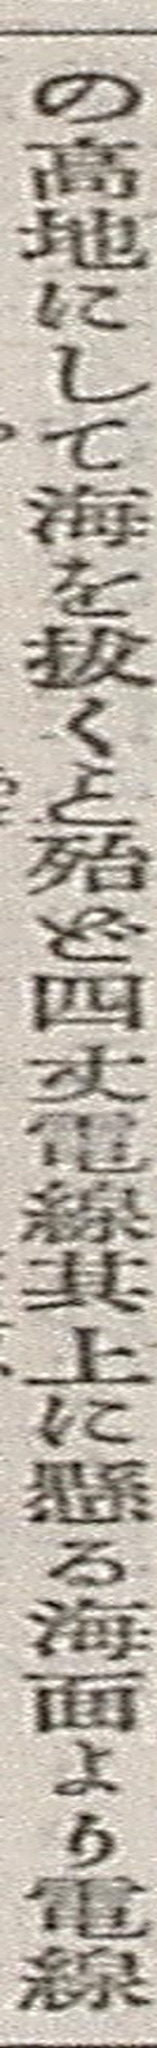の高地にして海を抜くと殆ど四丈電線其上に懸る海面より電線
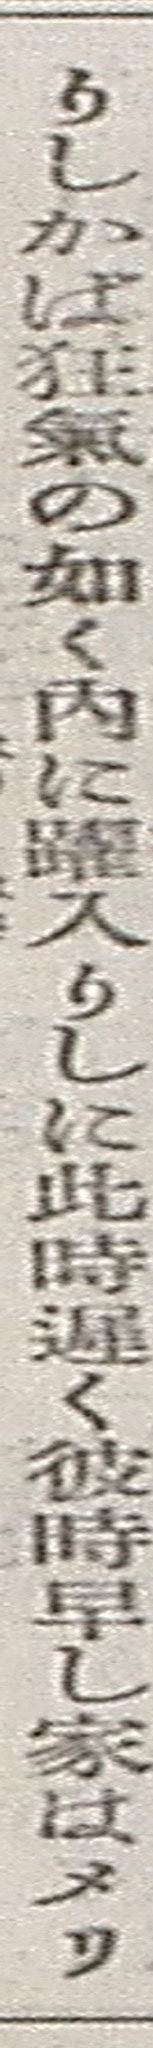りしかば狂気の如く内に躍入りしに此時遅く彼時早し家はメリ
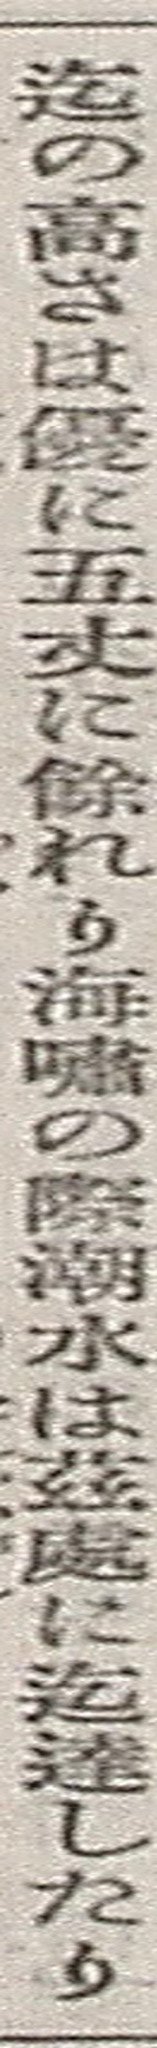迄の高さは優に五丈に余れり海嘯の際潮水は茲処に迄達したり
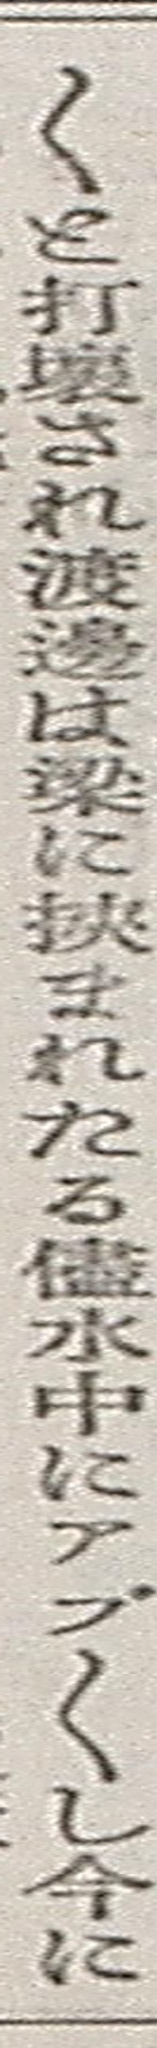〳〵と打壊され渡邊は梁に挟まれたる儘水中にアプ〳〵し今に
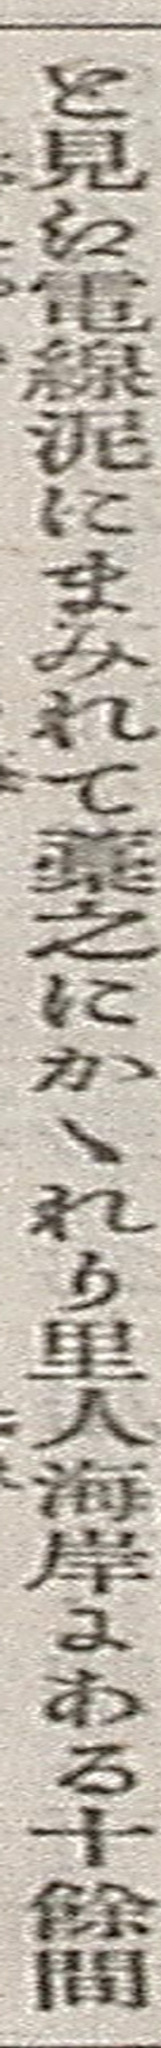と見え電線泥にまみれて藁之にかゝれり里人海岸にある十余間
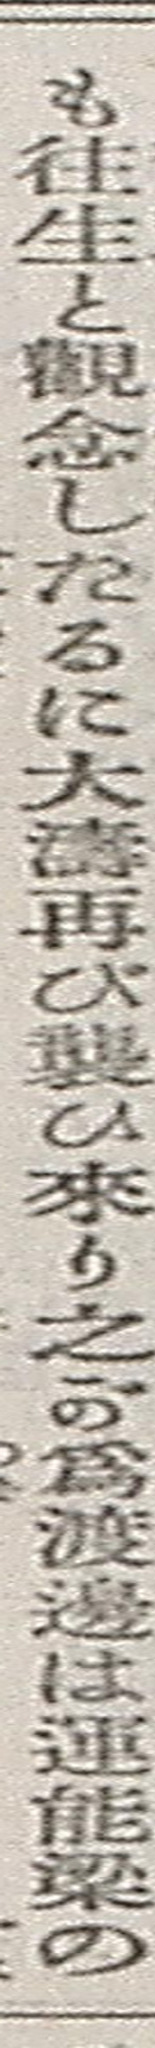も往生と観念したるに大濤再び襲ひ来り之が為渡邊は運能梁の
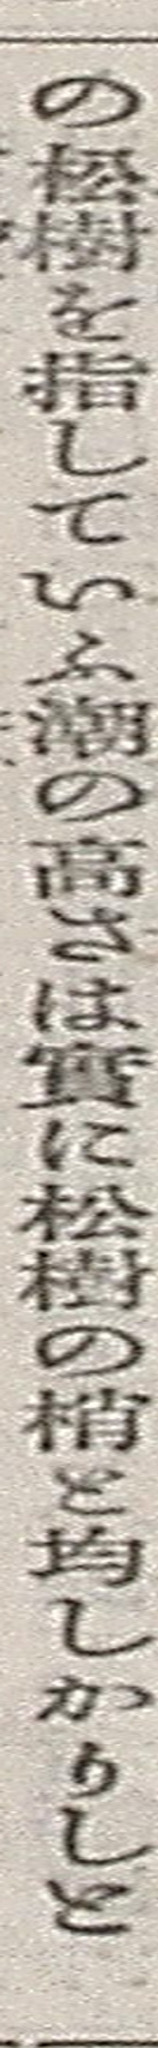の松樹を指していふ潮の高さは実に松樹の梢と均しかりしと
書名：風俗畫報臨時増刊第百十九號　大海嘯被害録（中）
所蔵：東京大学地震研究所図書室 Earthquake Research Institute Library, The University of Tokyo, JAPAN
